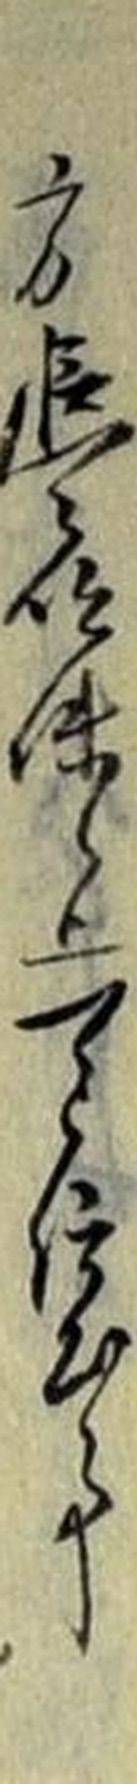方追々吟味之上可被仰出事
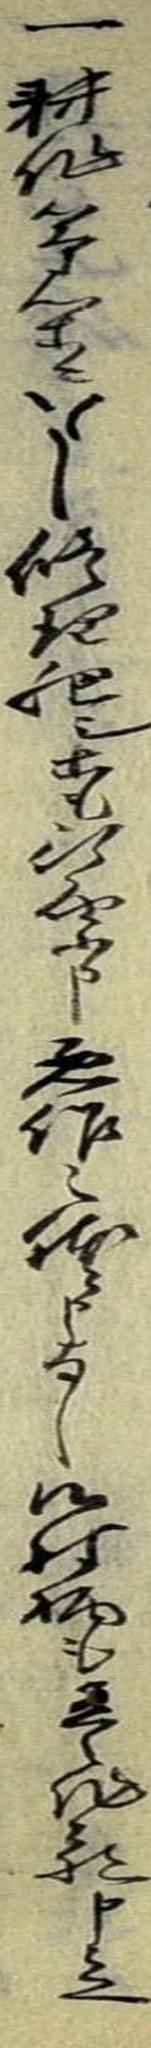一耕作等閑にいたし修理肥し等も行届不申悪作之体に申なし候村柄も有之作難申立
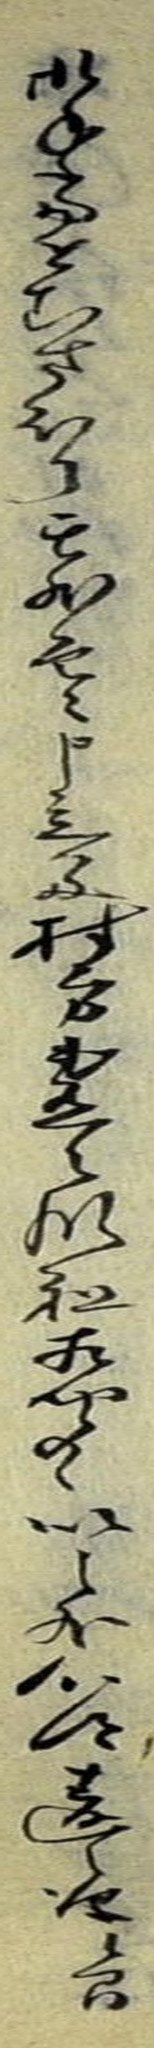御手当をむさほり其外色々申立多村方も有之段粗相聞候以之外心得違之儀候間
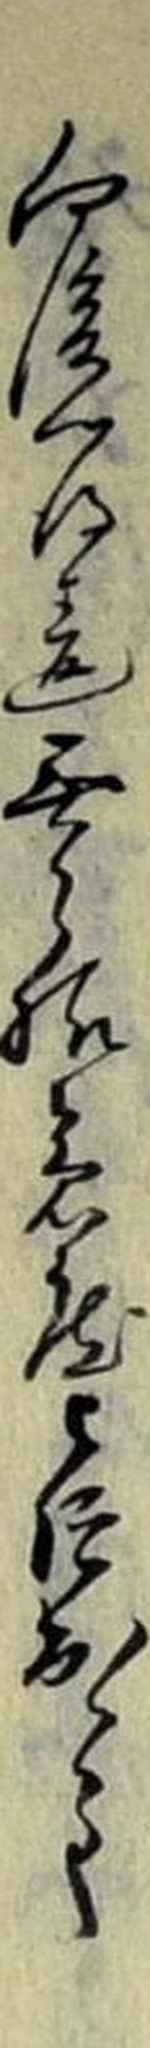向後心得違無之様急度被仰出候事
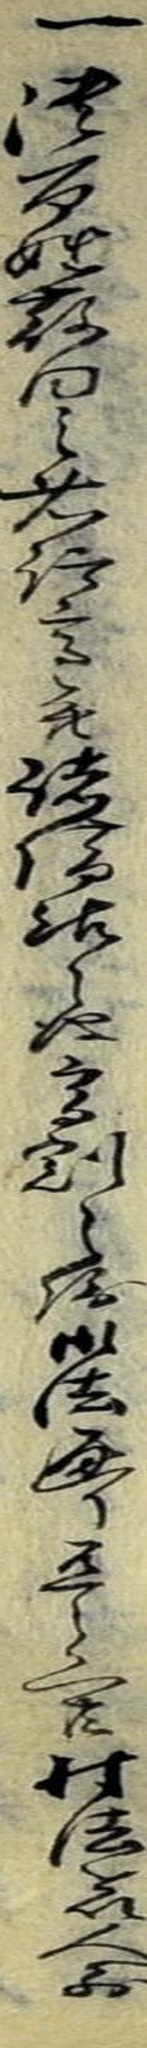一潰百姓散田之者跡高并諸借銀之儀高割之儀御法通り有之候へ共村法を以人別
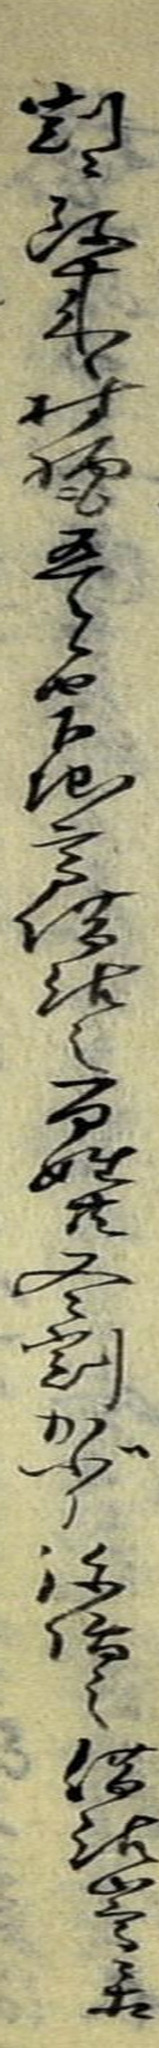割に致来候村柄も有之候由下地高借銀之百姓共又々割かぶり弥増之借銀嵩に相
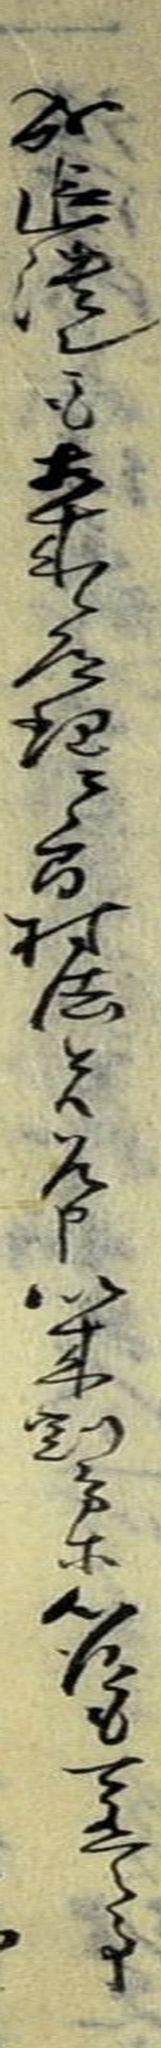成追潰れにも相来候道理に候間村法とは乍申以来割方等心得も可有之事
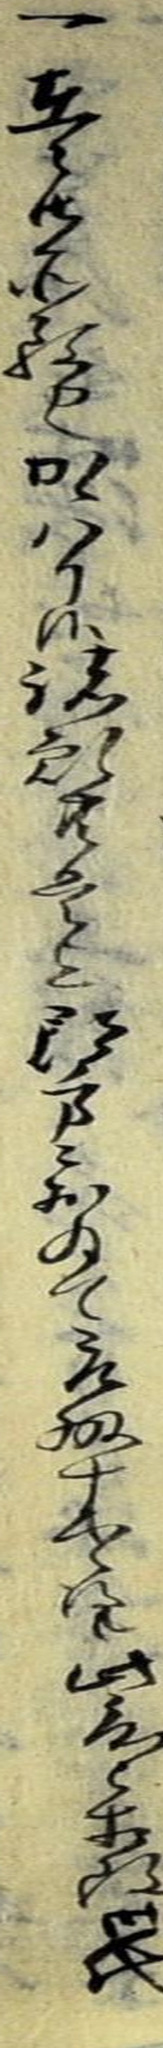一在々御所務へかゝはり候諸願共是迄郡方におゐて取扱来候得共此度被相改御代
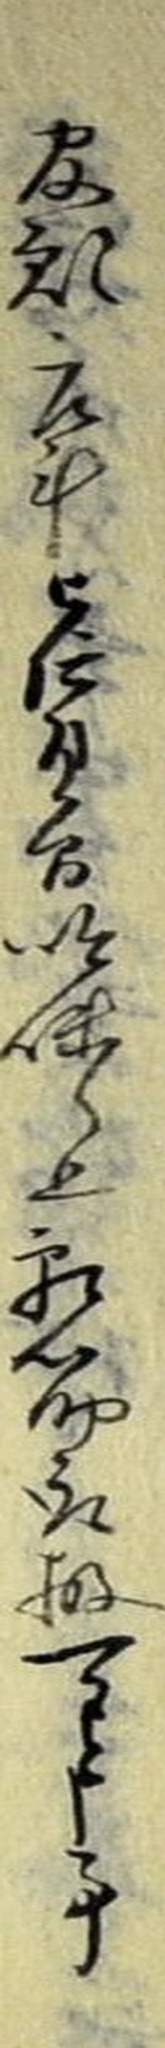官願取斗被仰付候間吟味之上願筋取扱可被申事
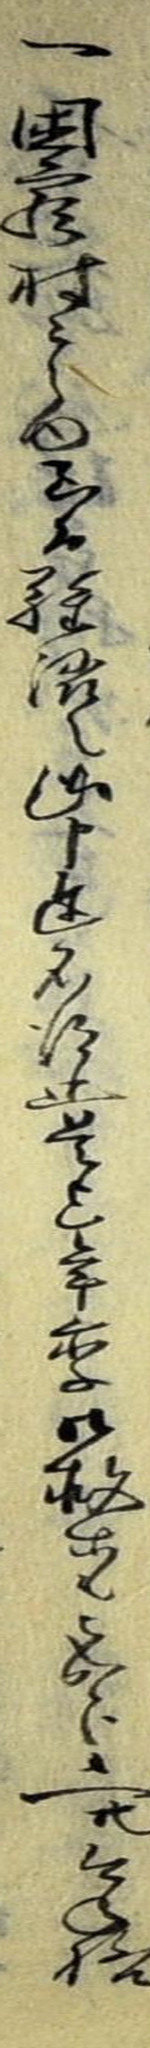一困窮村々之内至而難渋之趣申達不得止是迄年季御救等も被成下候へ共今年格
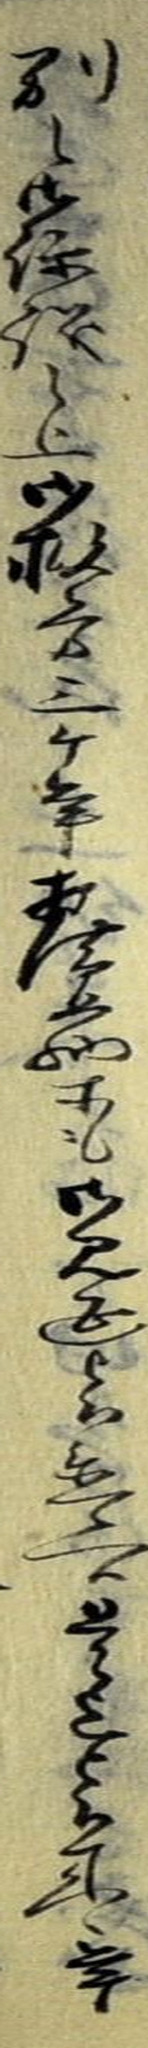別之御評議之上御救方三ケ年拝借上納等も御見延被下置候へは是迄被下来候年
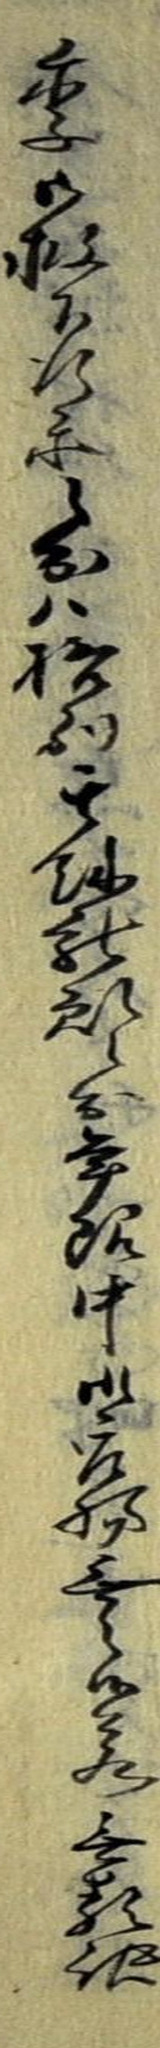季御救下行米之分は格別其余新願之分年限中御取揚無之候若無類訳

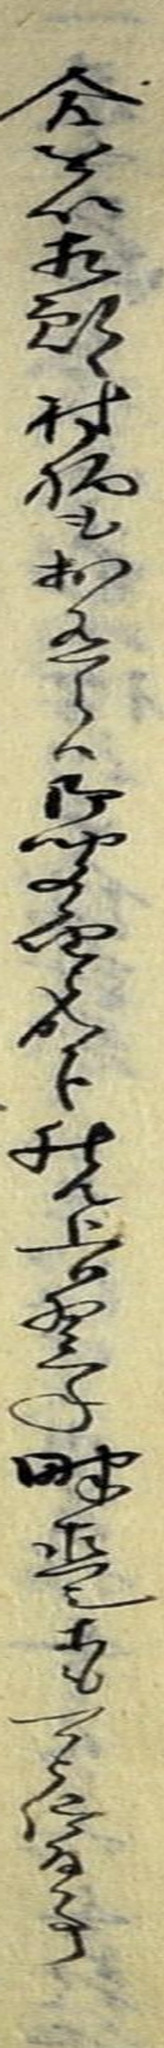合を以相願候村柄も於有之は御聞届被成下然る上は翌年畦直し等も可被仰付事
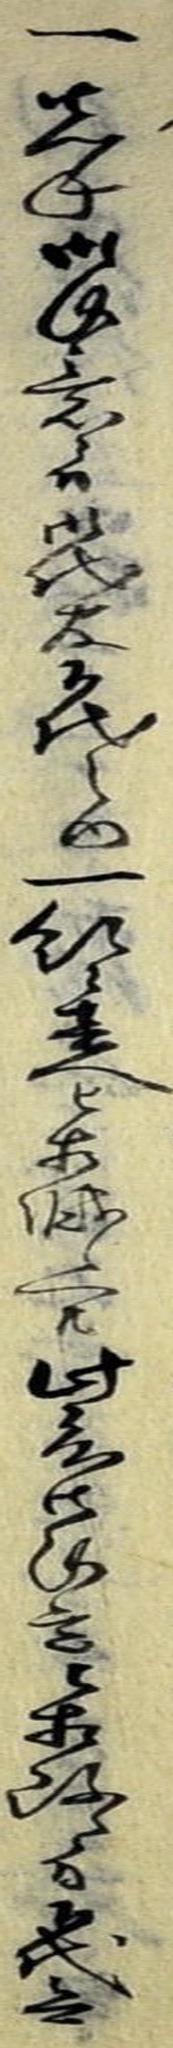一先年御趣意に付御代官下代之内一領に壱人被相減候へ共此度御趣意被相改候に付下代壱
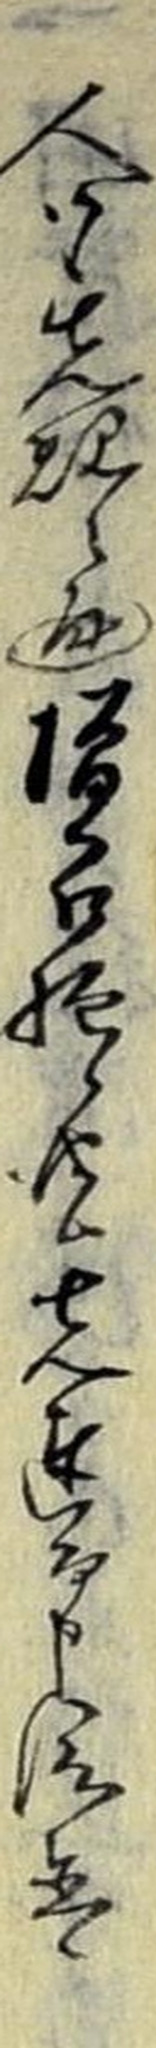人ツヽ先規之通増召抱候儀は先達而申渡置候
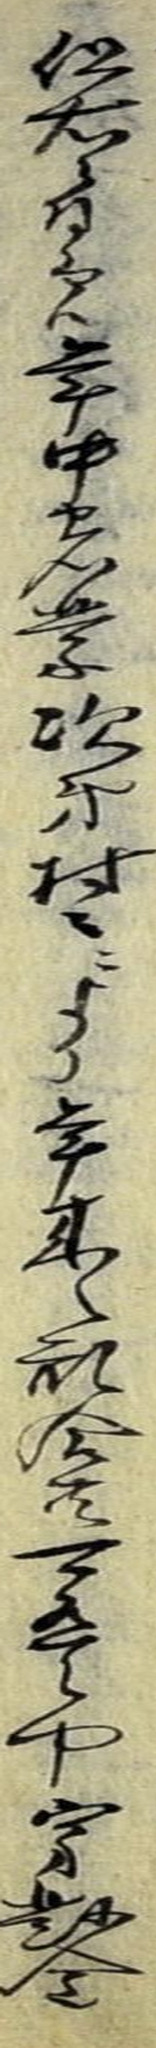但右に付而は年中農業次第村々により年来之形合共可有之中穿鑿
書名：命令之部 二
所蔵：福井県文書館 Fukui Prefectural Archives
